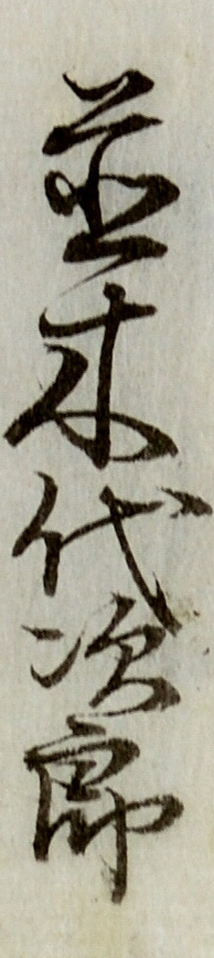並木代次郎
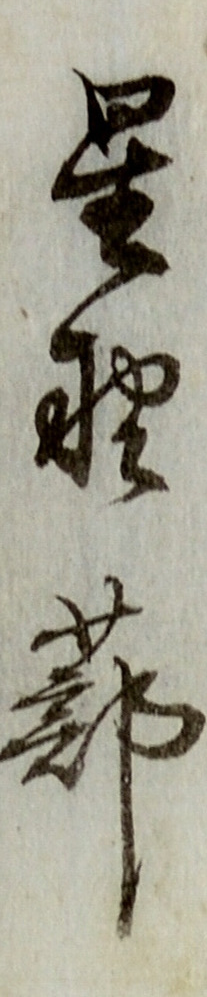星野蔀

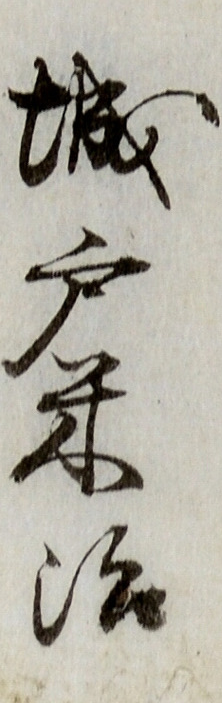城戸米治
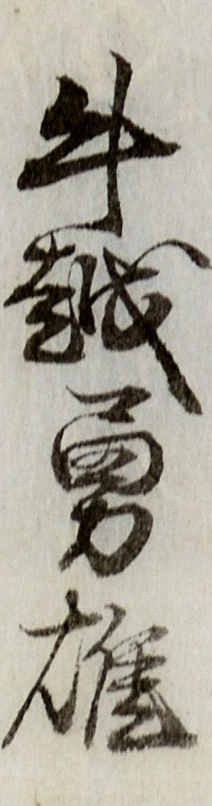牛越勇雄
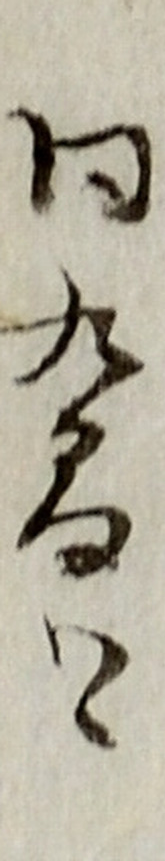同九間ツヽ
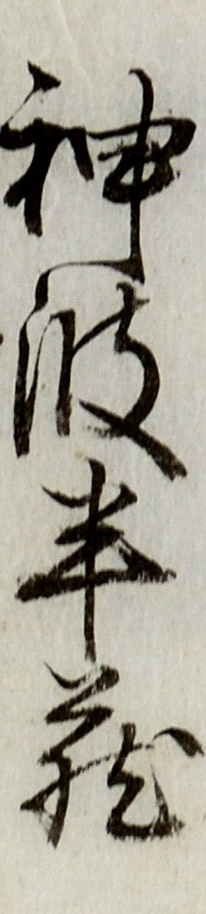神波半蔵
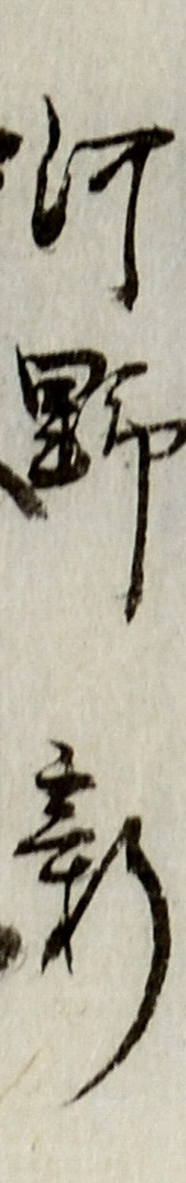河野新
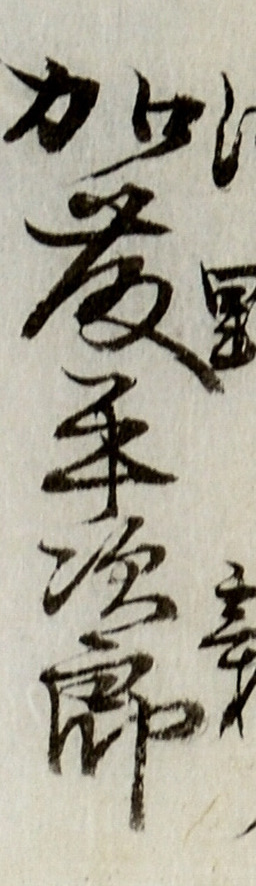加藤平次郎
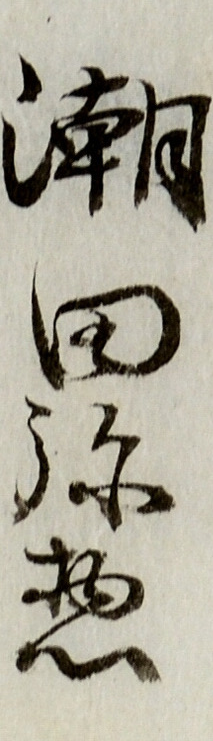潮田弥惣
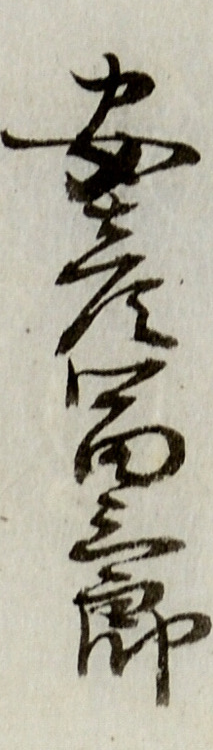安彦冨三郎
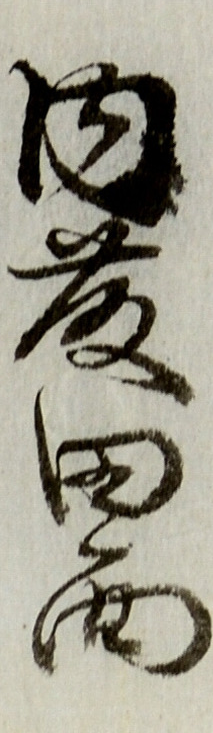内藤田面
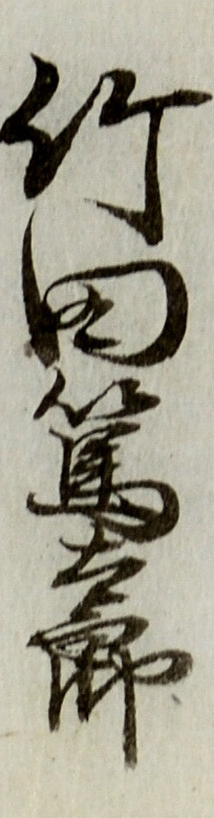竹田篤太郎
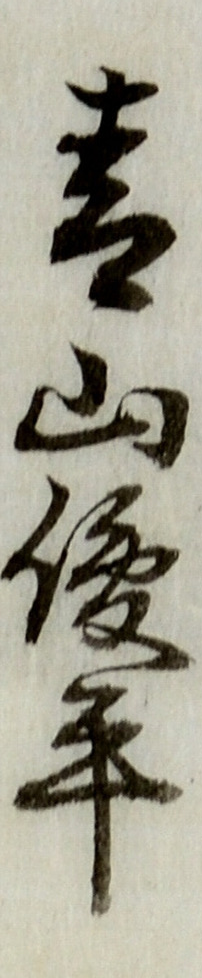青山俊平
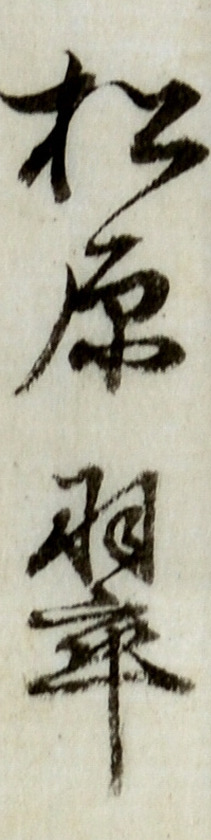松原羽卒

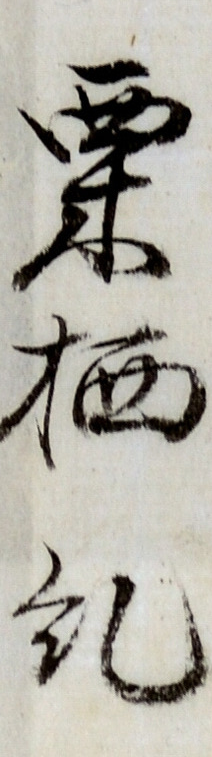栗栖紀
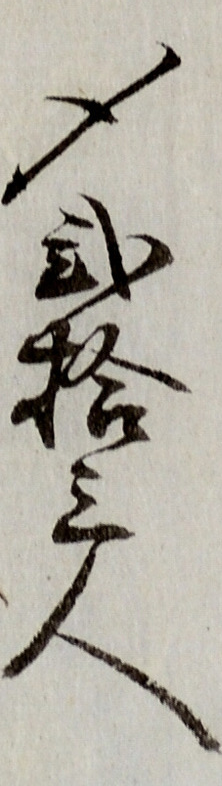〆弐拾三人
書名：御藩中薪渡割合帳
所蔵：伊那市立高遠町図書館・合同会社AMANE
